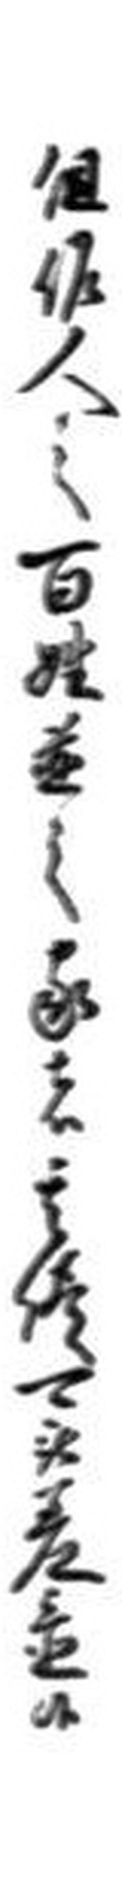但作人之百姓並之家者其儘可被差置候
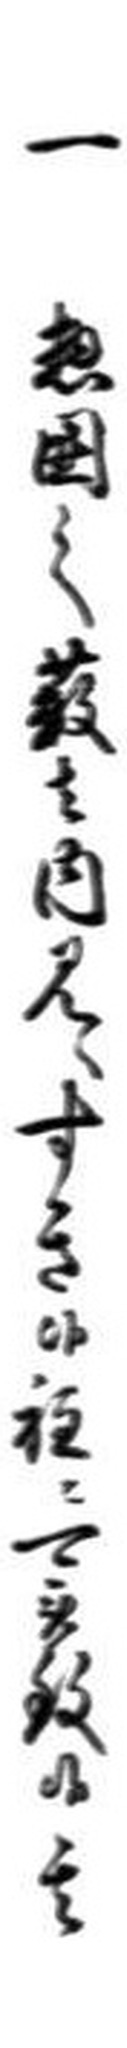一惣囲之薮者内見へすき候程ニ可被致候其
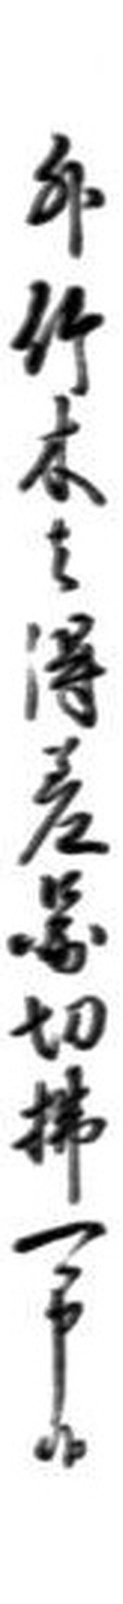外竹木者得差図切払可申候
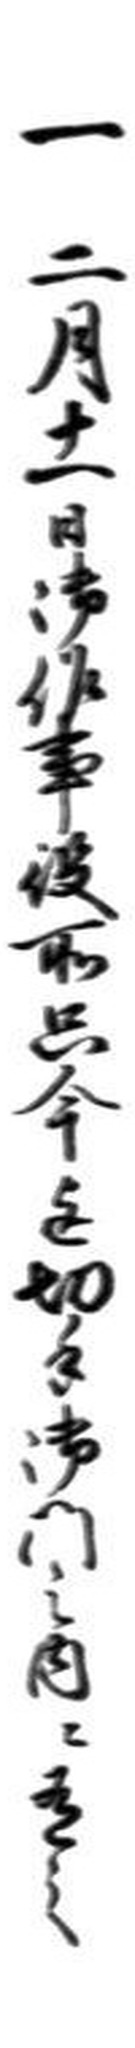一二月十一日御作事役所只今迄切手御門之内ニ有之
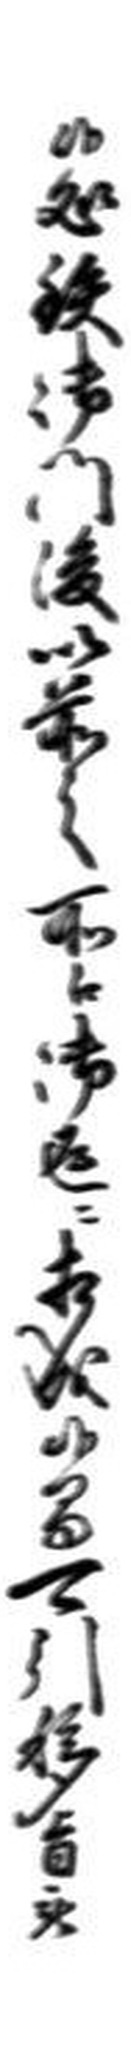候処鉄御門後以前之所江御返ニ相成候間可引移旨被

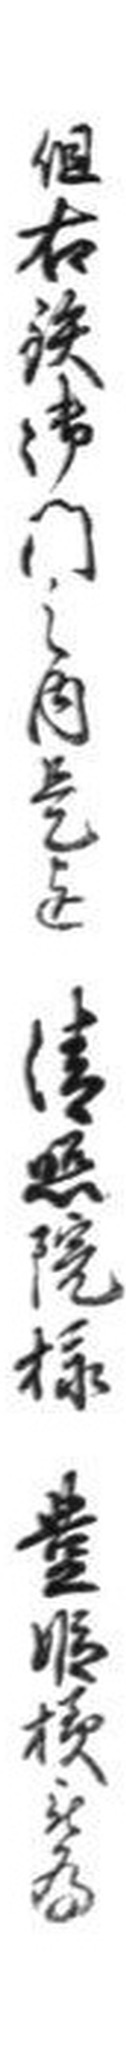但右鉄御門之内是迄清照院様豊姫様被為
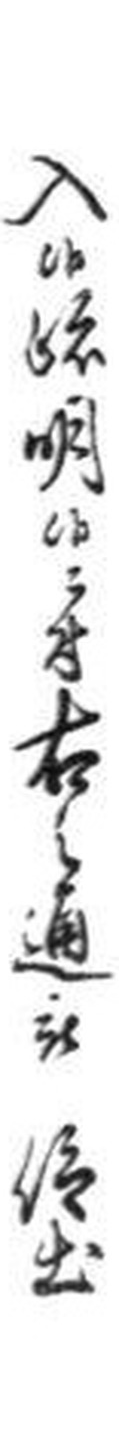入候跡明候ニ付右之通被仰出
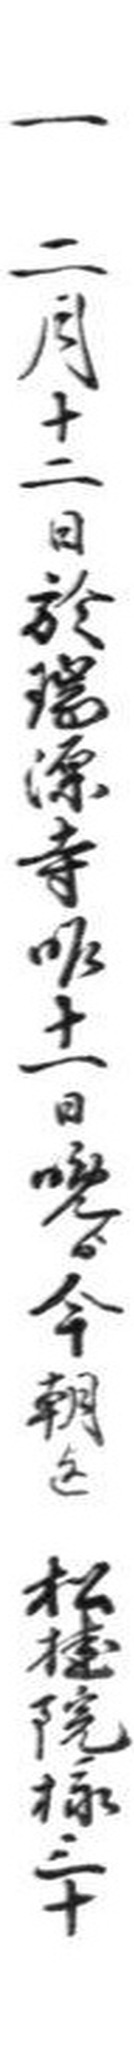一二月十二日於瑞源寺昨十一日晩ゟ今朝迄松桂院様三十
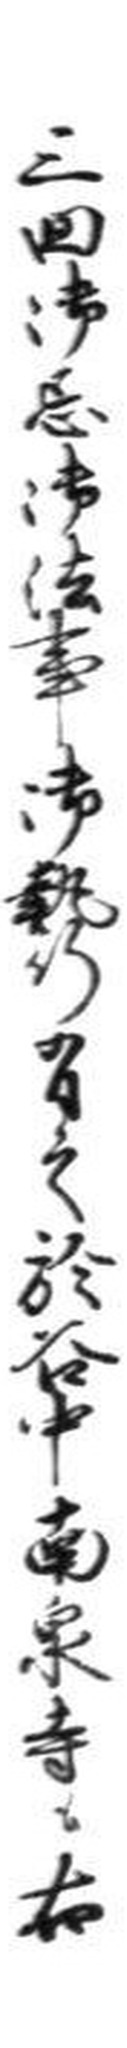三回御忌御法事御執行有之於谷中南泉寺も右
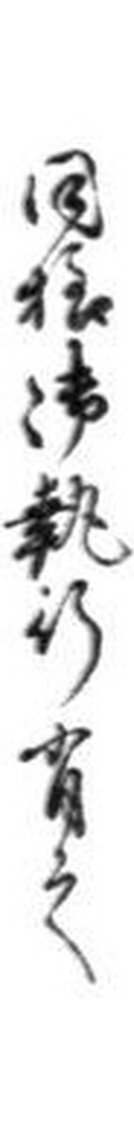同様御執行有之
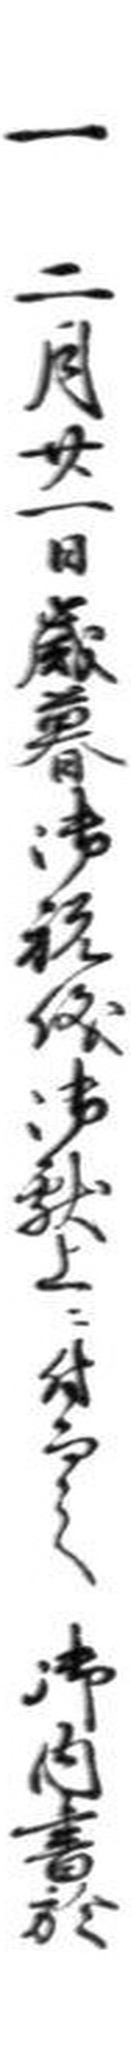一二月廿一日歳暮御祝儀御献上ニ付而之御内書於
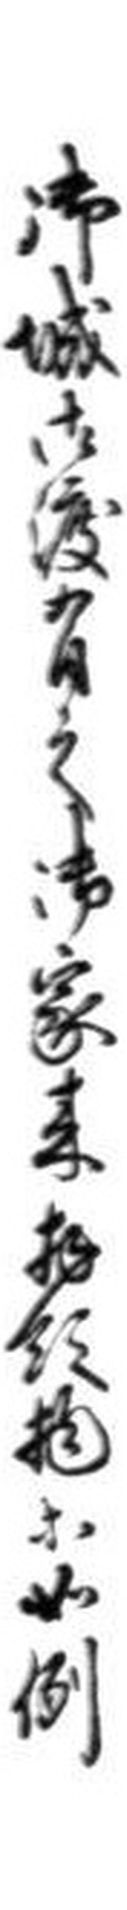御城御渡有之御家来拝領物等如例
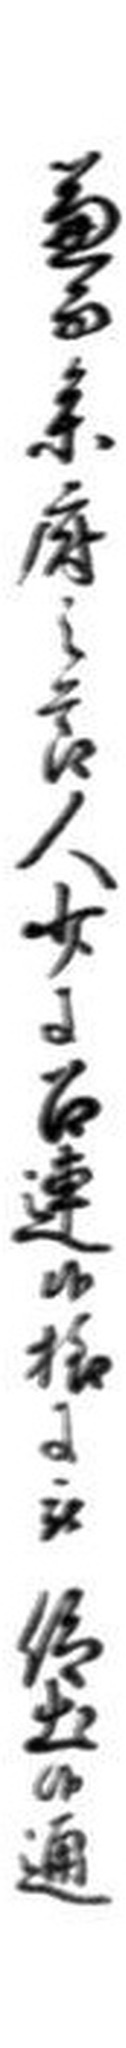兼而参府之節人少に召連候様に被仰出候通
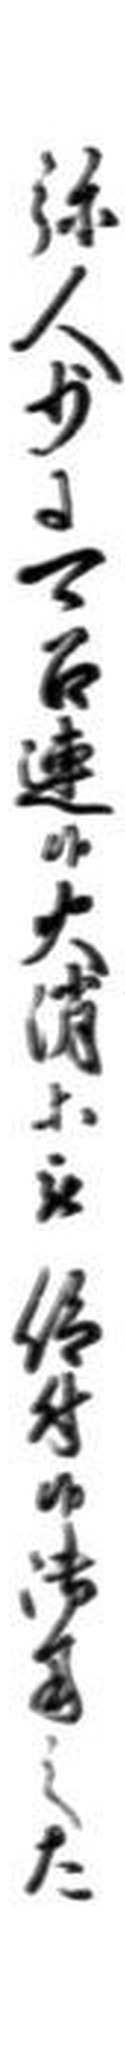弥人少に可召連候火消等被仰付候御用之た
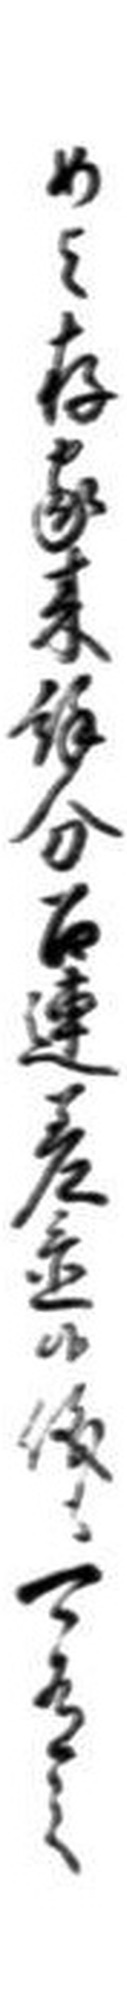め与存家来余分召連差置候儀も可有之
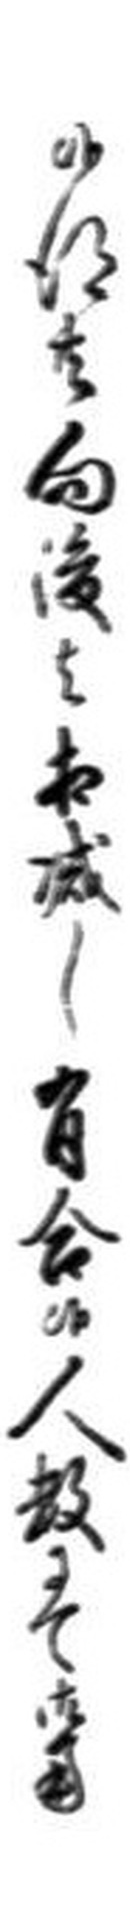候得共向後者相減し有合候人数にて御用
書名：家譜 三十二 吉邦公 従享保二年到享保三年
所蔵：福井県文書館 Fukui Prefectural Archives
